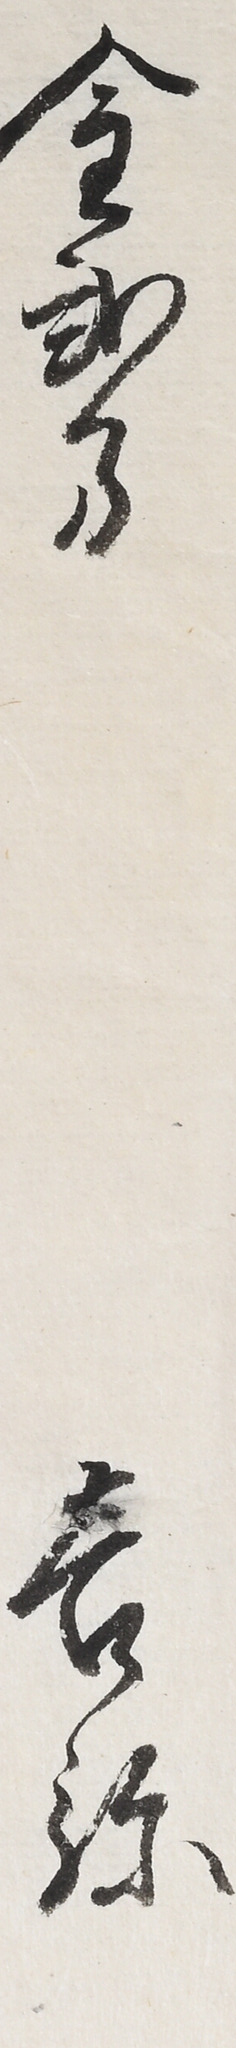金弐分吉弥
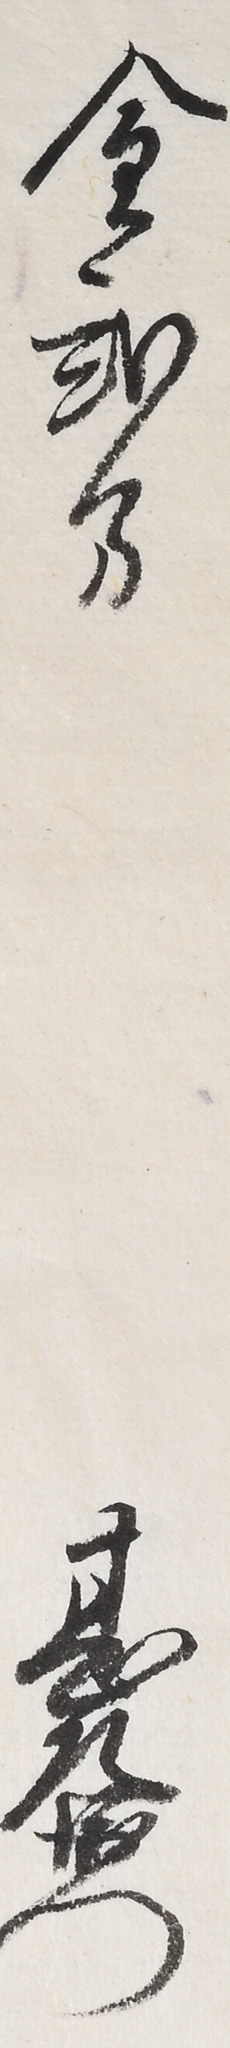金弐分甚左衛門
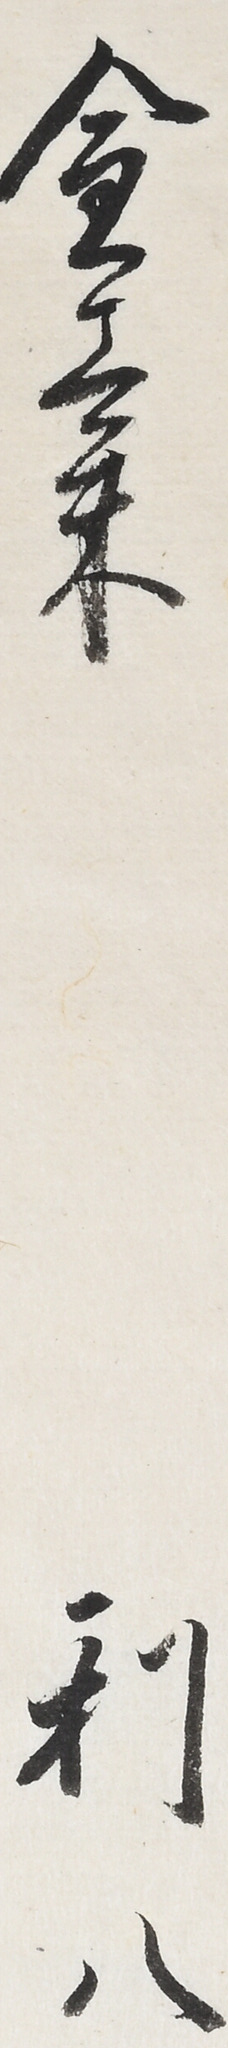金壱朱利八
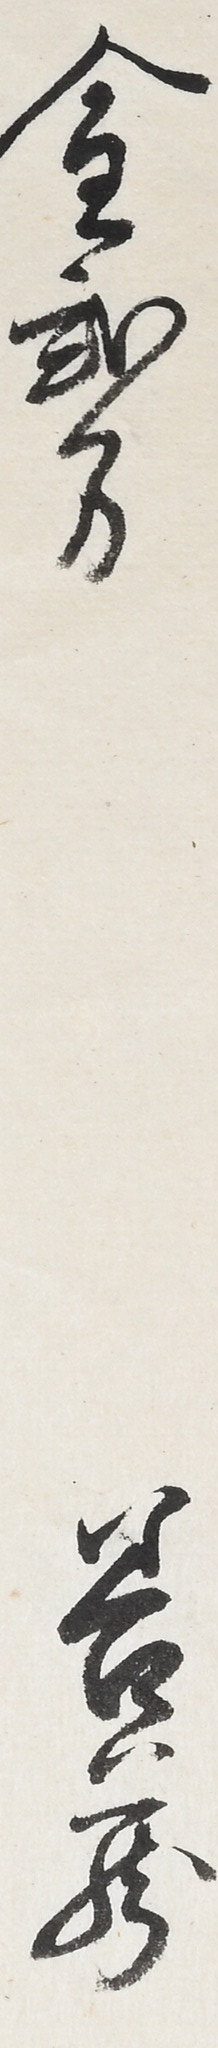金弐分善蔵
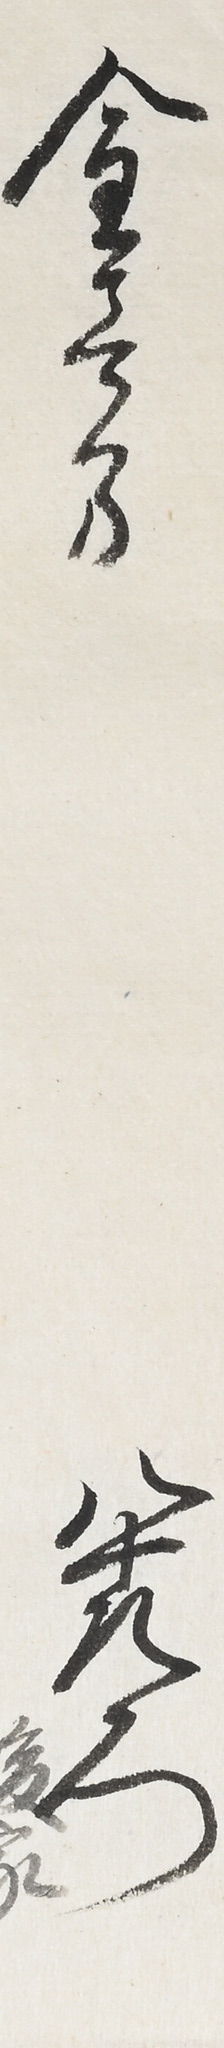金壱分八十左衛門
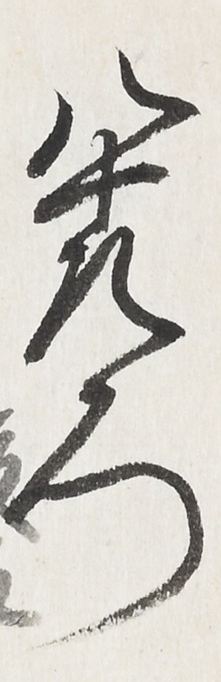金壱分八十左衛門
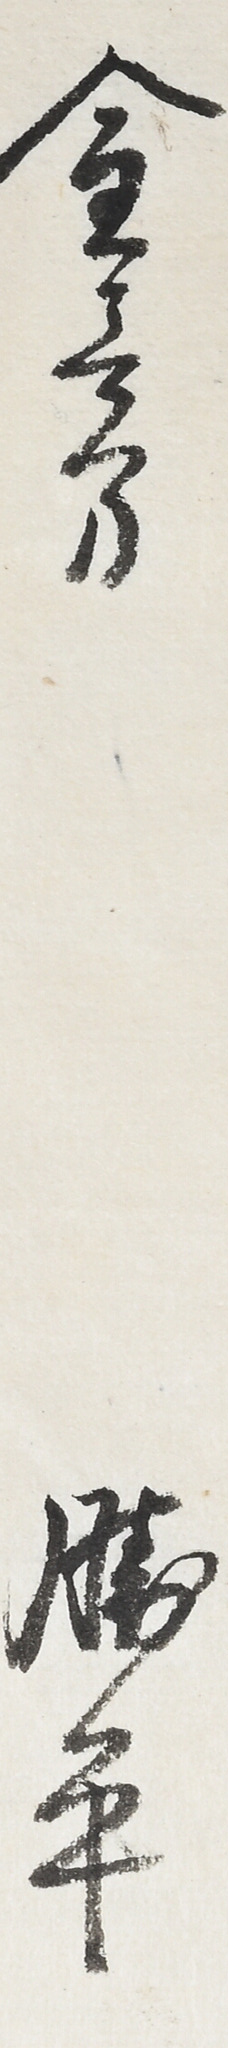金拾分勝平

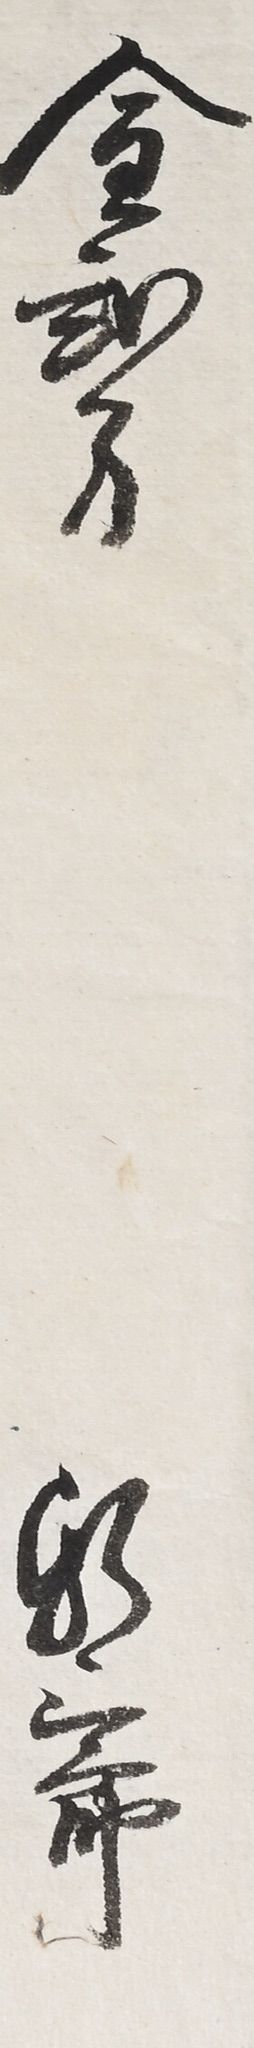金弐分新三郎
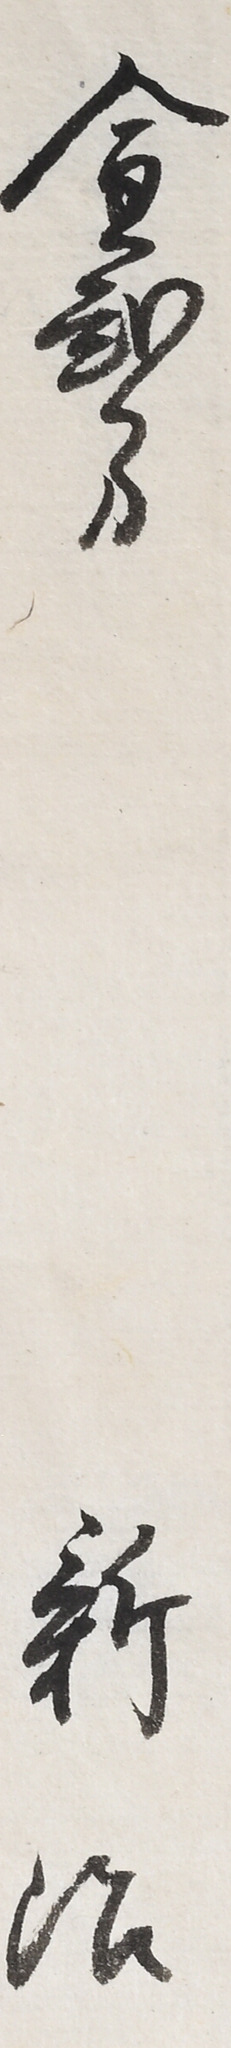金弐分新治
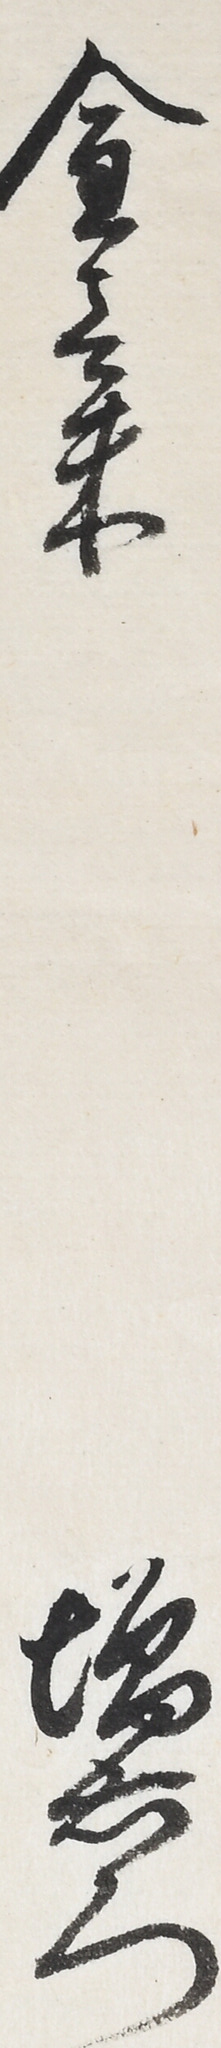金壱朱増右衛門
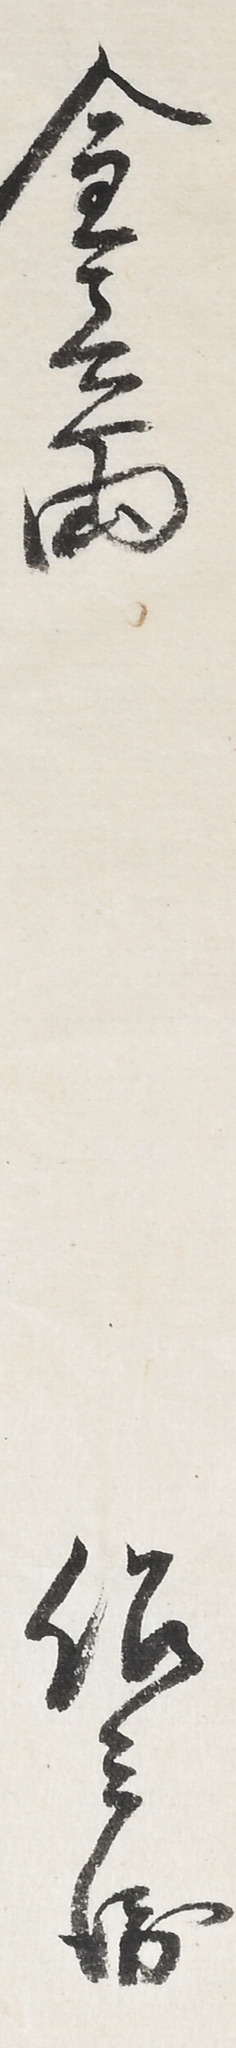金壱両作兵衛

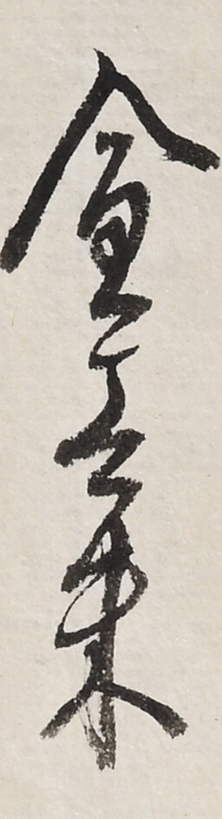金壱朱
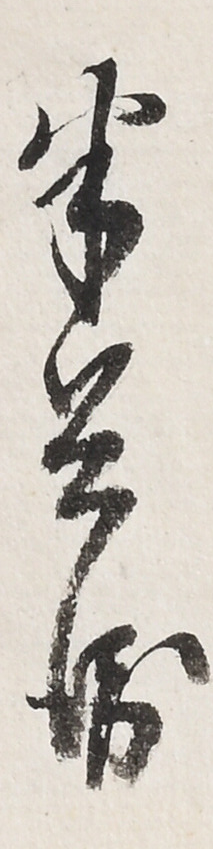半兵衛
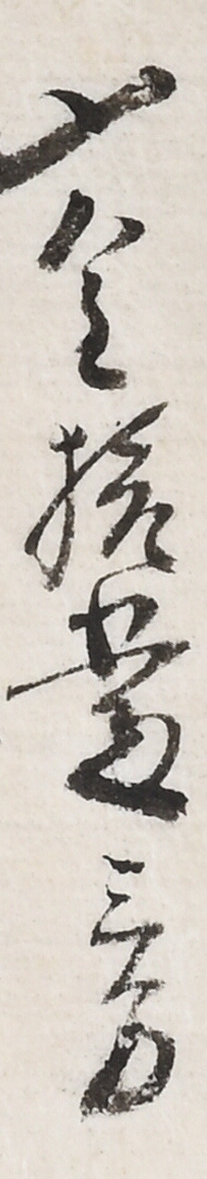〆金拾五両三分
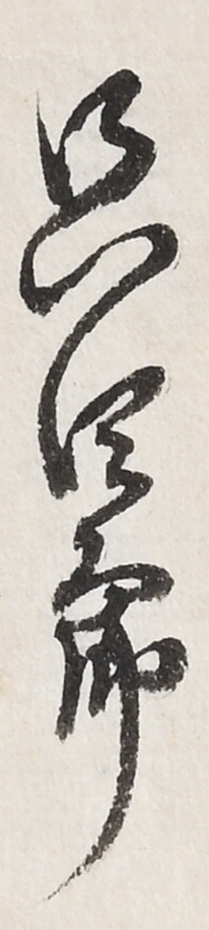只四郎
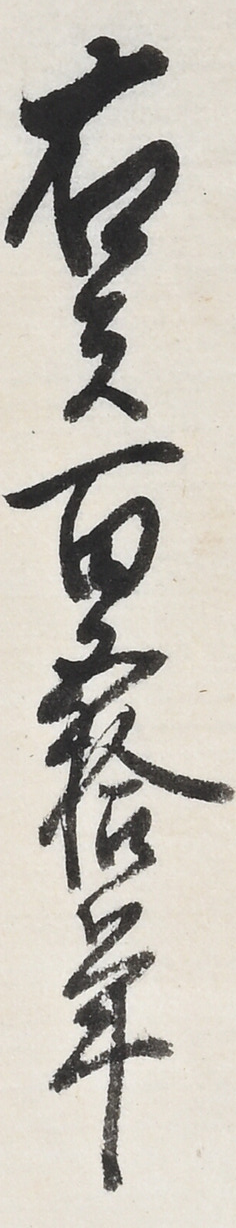右は百五拾年
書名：御拝地百五拾年御祝儀献上御目録名前
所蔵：伊那市立高遠町図書館・合同会社AMANE
